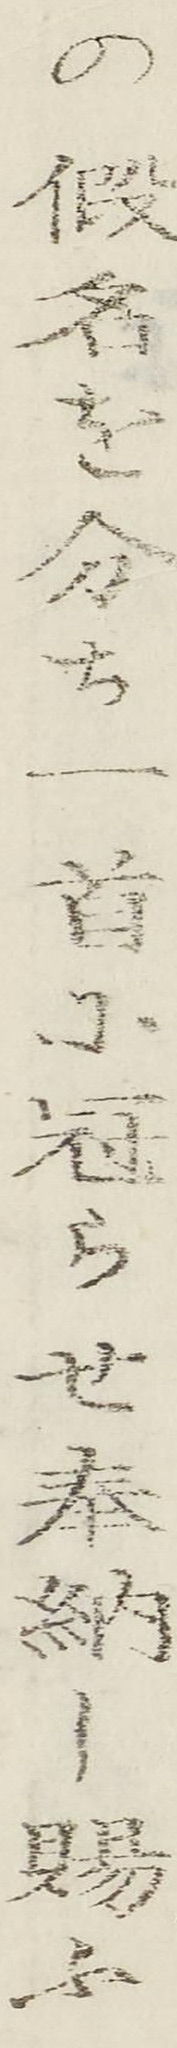の仮名を分ち一首に冠らせ奉納し賜ふ

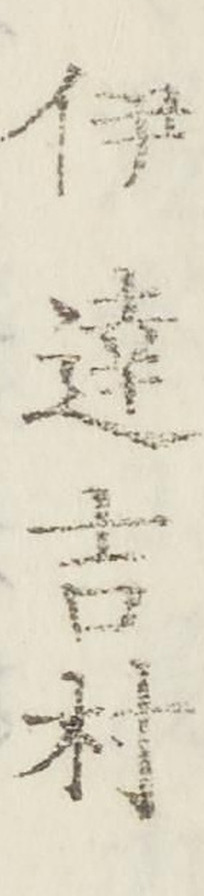伊達吉村
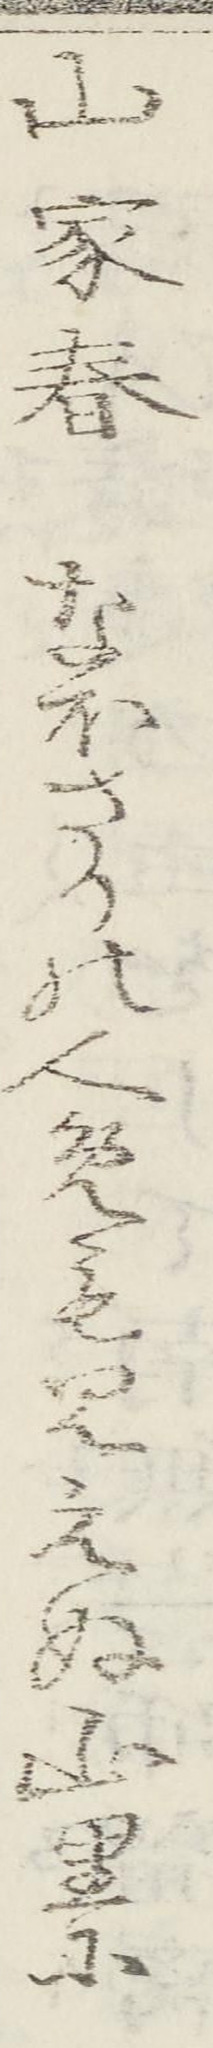山家春なほさりの人めも見えぬ山里に
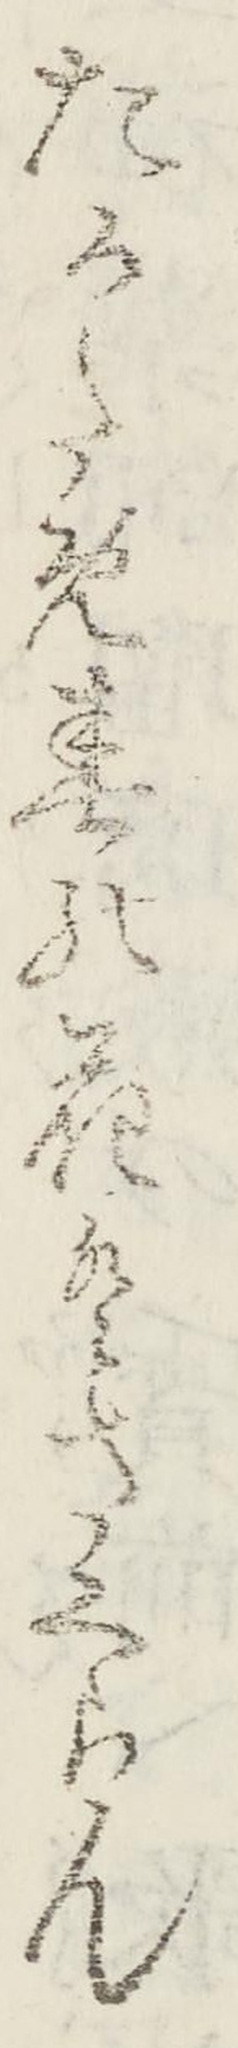たかため春の花はさくらん
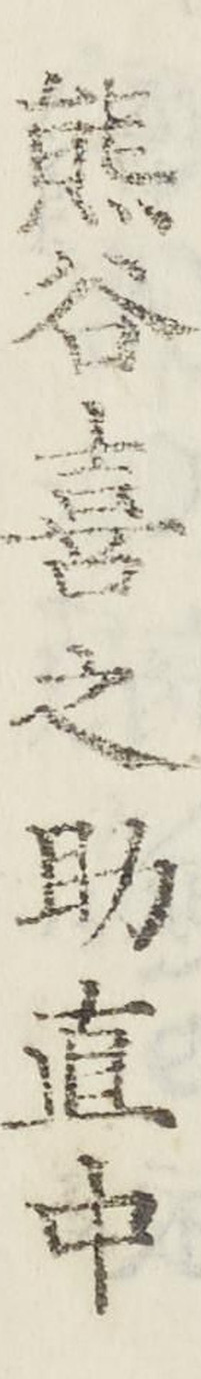む熊谷喜之助直中
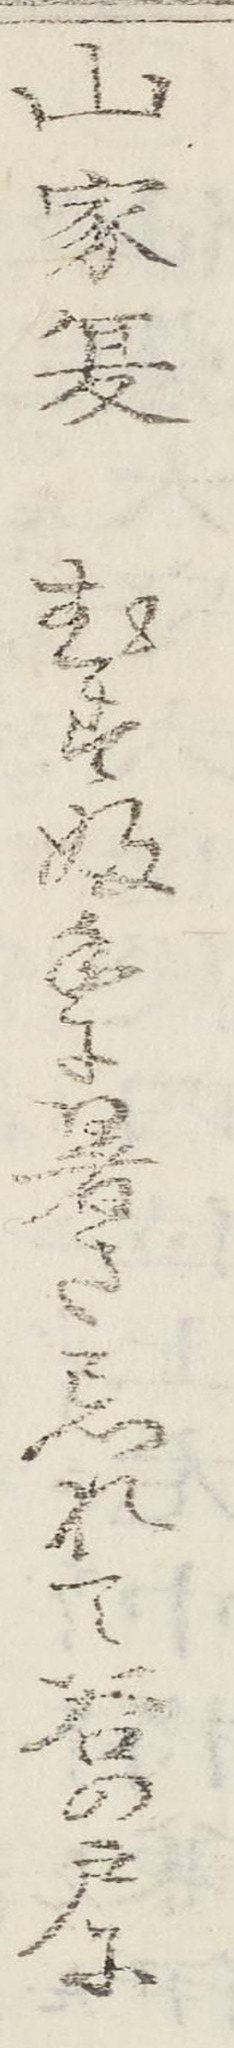山家夏むすふねに暑さ忘れて谷の戸に
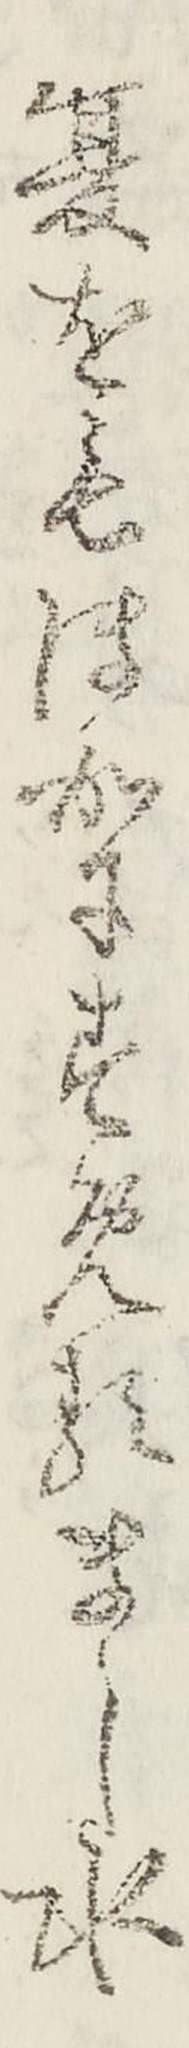夏をもほかにすめるまし水
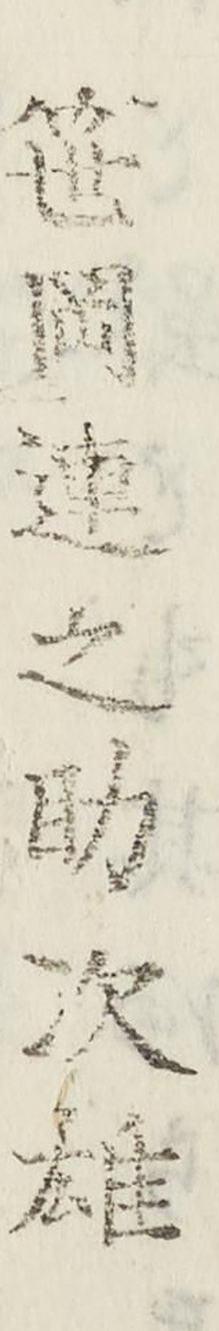や笹岡連之助次雄
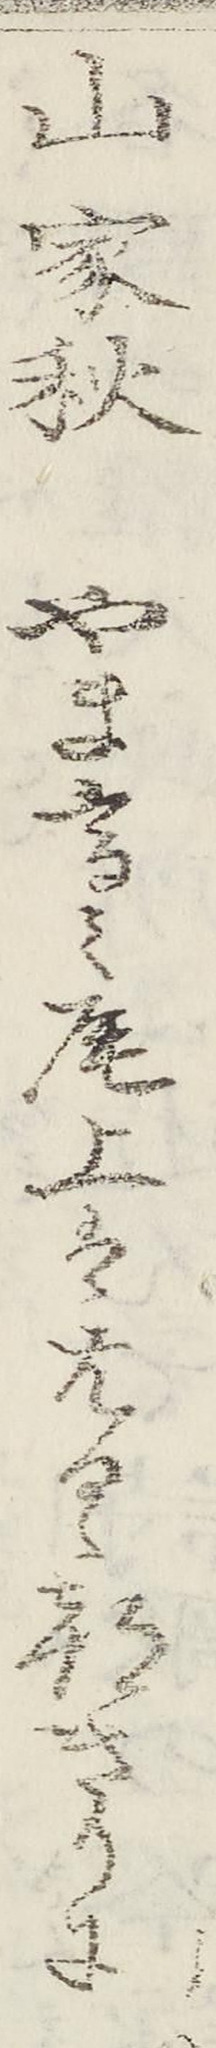山家秋やま高く尾上ははるゝ朝きりに
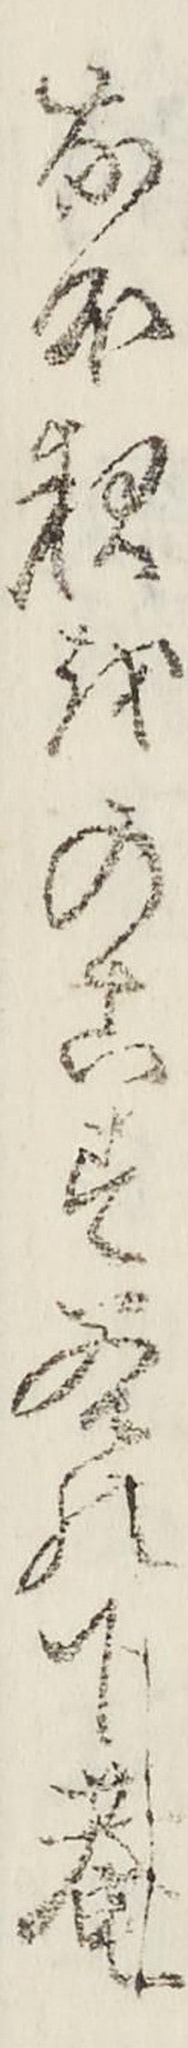なほ夜をのこす谷の下庵
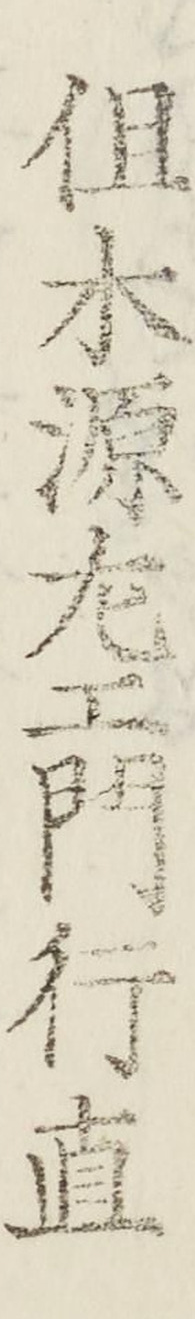く但木源左エ門行直
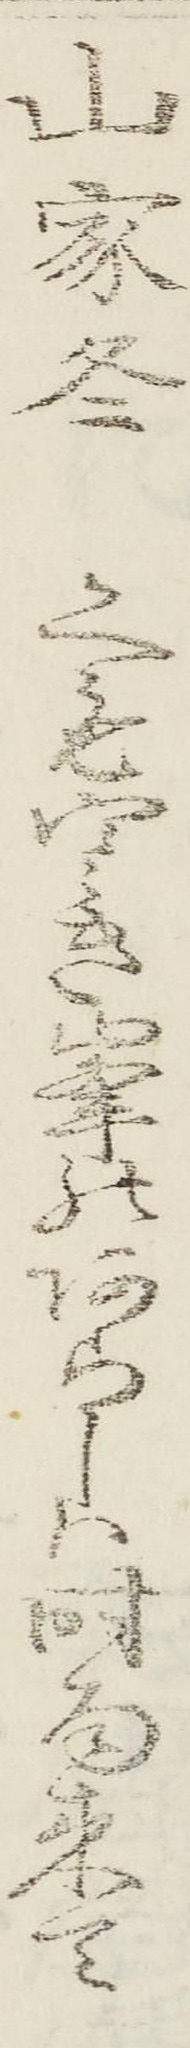山家冬くも寒き峯のあらしは時雨来て
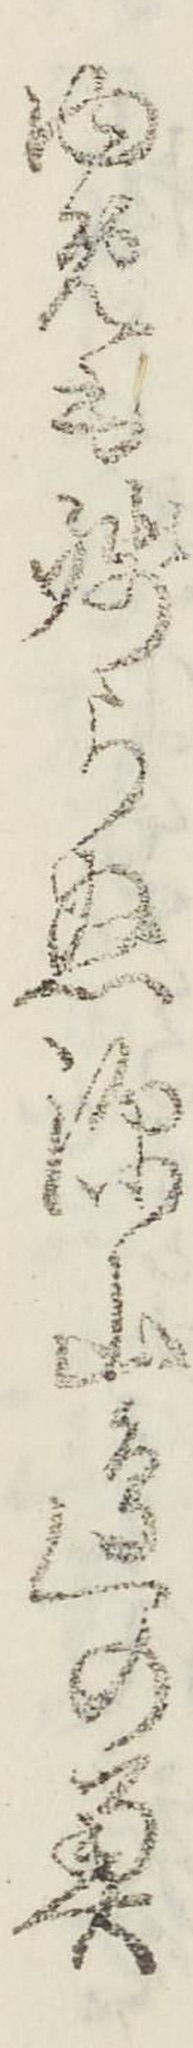ゆめも残らぬ深山辺の奥
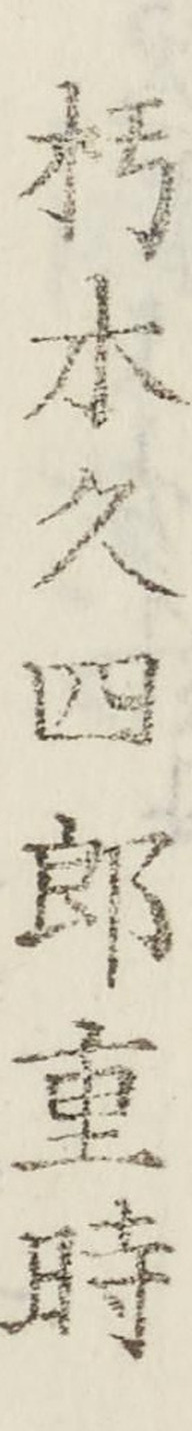し朽木久四郎重時
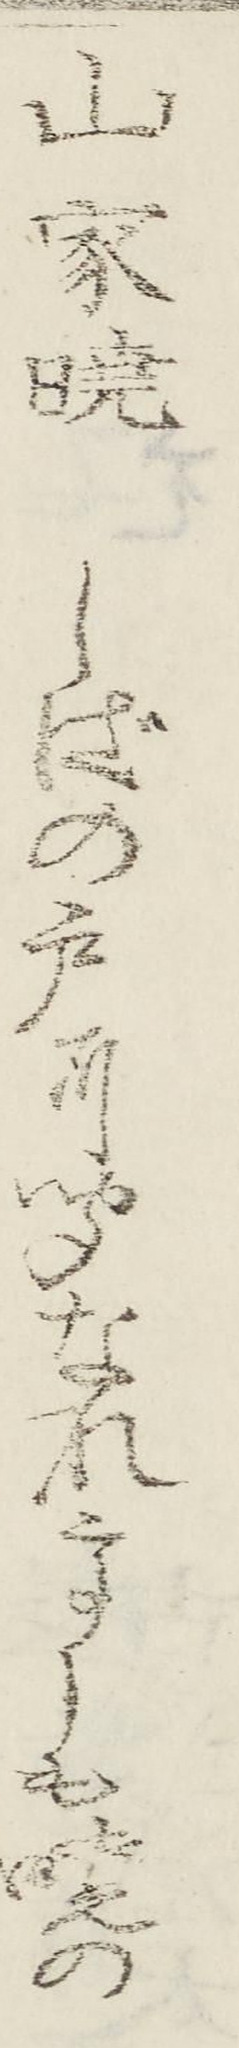山家暁しばの戸に聞くなれてしも暁の
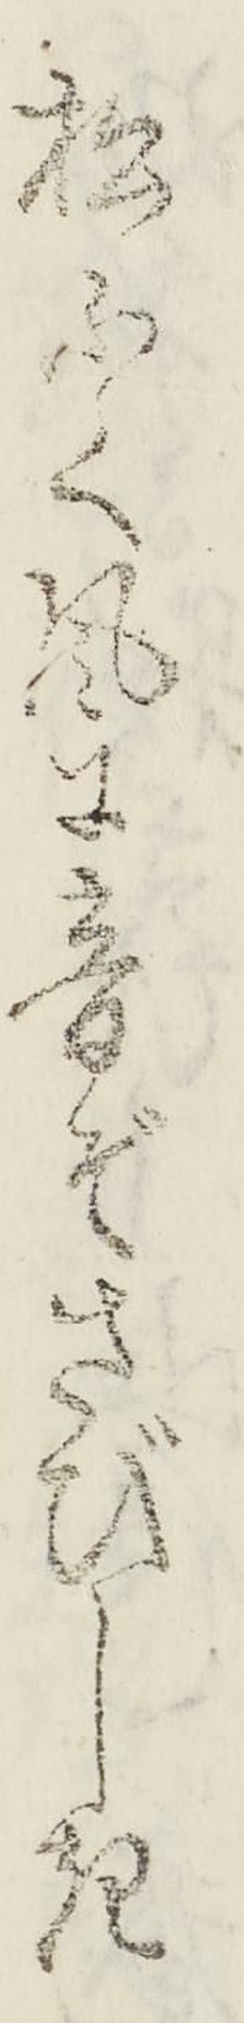松ふく風に音ぞさびしき
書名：鎌先温泉由來記
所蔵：東京大学地震研究所図書室 Earthquake Research Institute Library, The University of Tokyo, JAPAN
